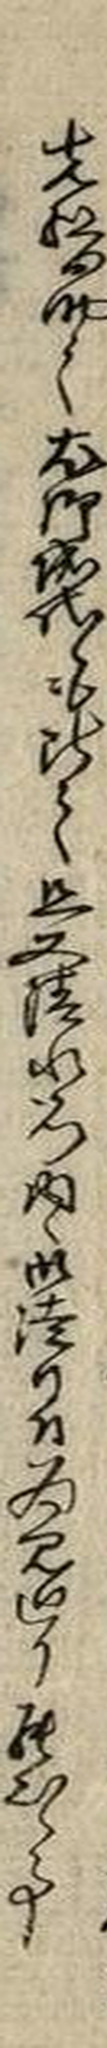先組ゟ助之尤御城代へも断之且又清水御門内へ御徒目付為見廻り罷出候事
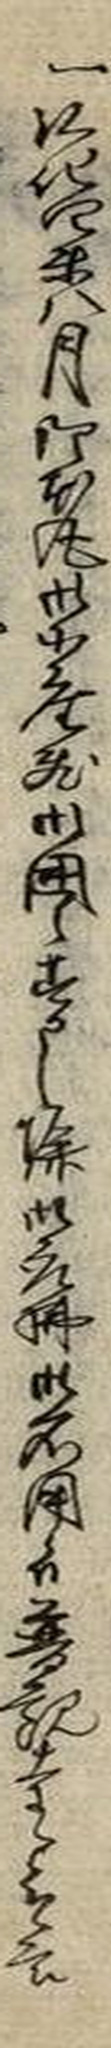一弘化四未八月御本丸御小座敷御囲之すかし塀御取払御不用に付普観寺へ被下候節
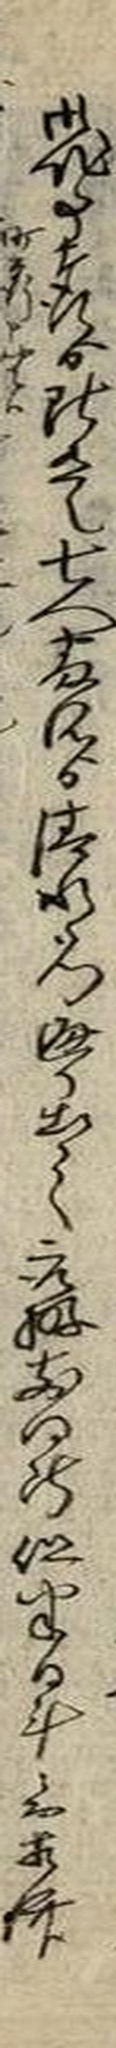御作事奉行ゟ断有之七人番所ゟ清水御門通り出之取扱前同断但半日斗に而相済
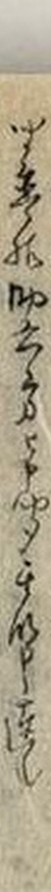聞置候様助六方被申聞候其段申達候
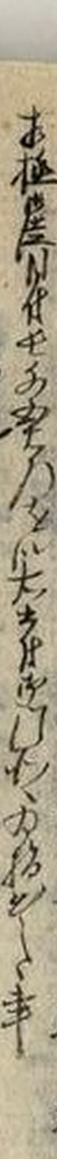相極御徒目付毛受五右衛門を以右書付御門所へ為指出候事
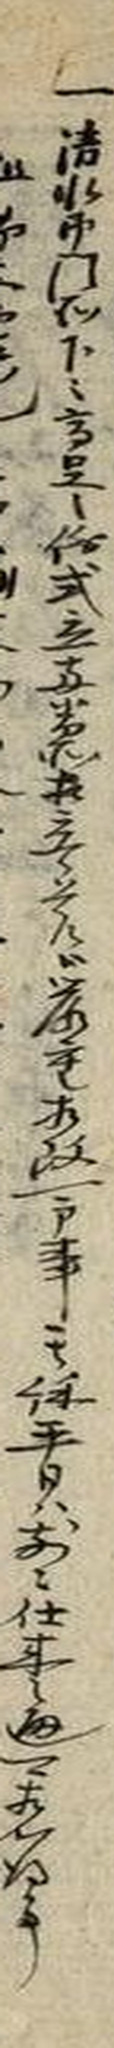一清水御門所下々高足之儀式立両番所相立候節は厳重相改可申事其余平日は前々仕来之通可相心得候事
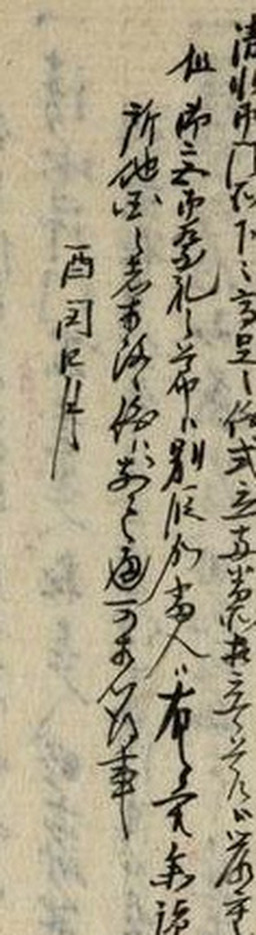所他国之者相改候儀は前々之通可相心得候事
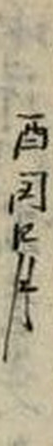酉閏四月

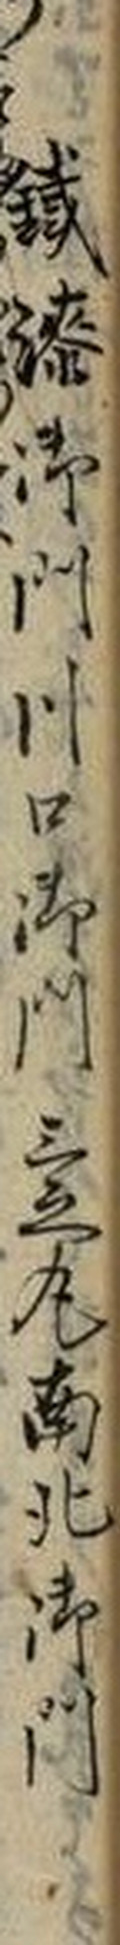鉄漆御門川口御門三之丸南北御門
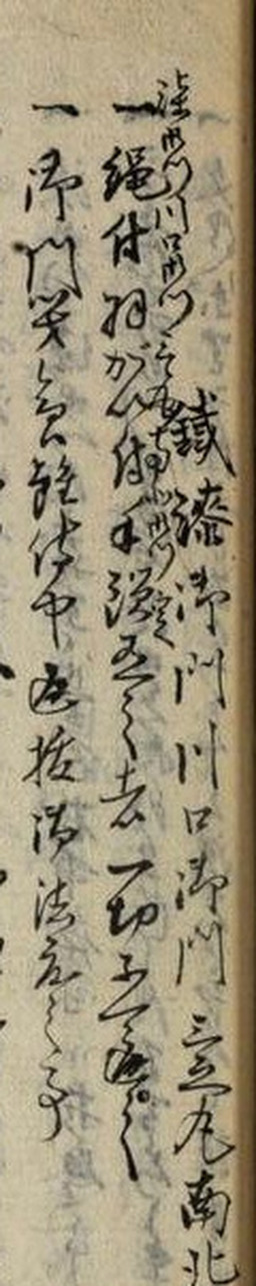一縄付羽がい付手鎖有之者一切不可通之
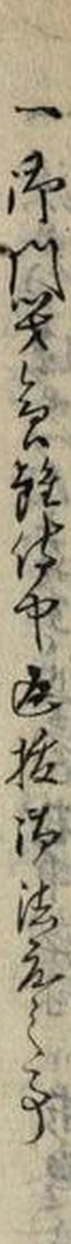一御門閉候而は雖待中通抜御法度之事
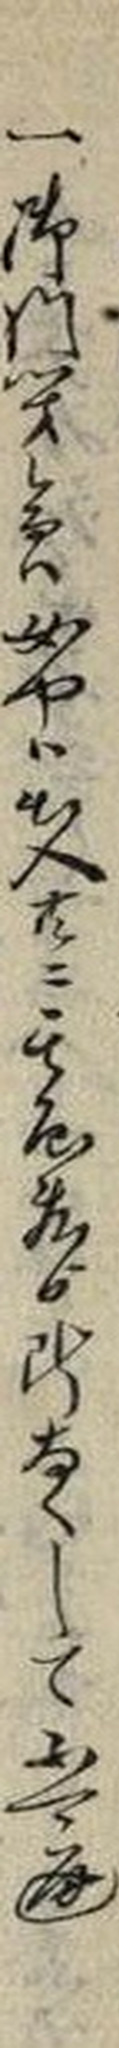一御門閉候而は女中は出入共に其屋敷ゟ断なくして不可通
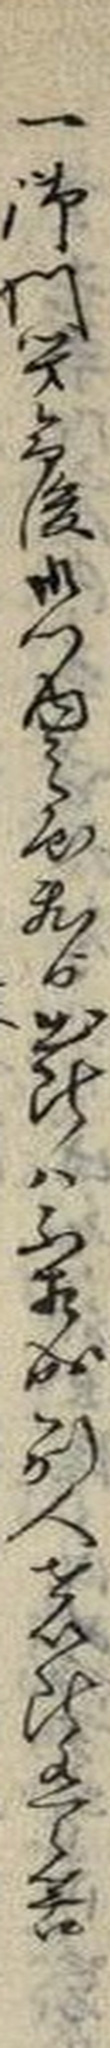一御門閉候而後御門内之屋敷ゟ出断は不相成別人を以断有之候筈
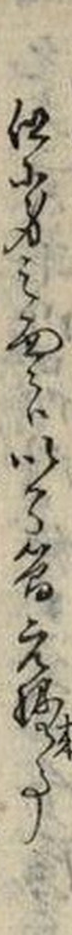但小身之面々は以了簡取扱来候事
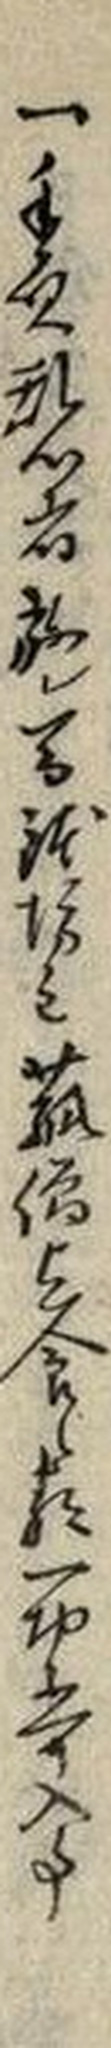一手負乱心者放れ馬鉢坊主菰僧乞食之類一切不可入事
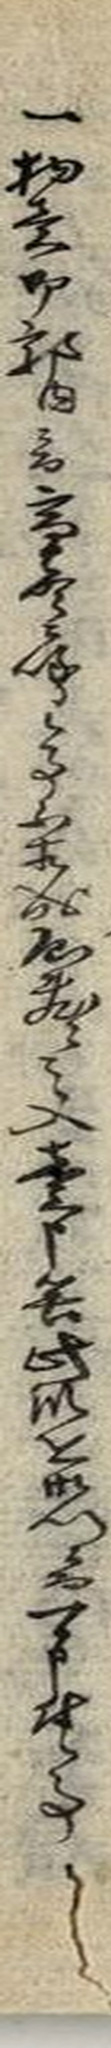一物売御郭内に而高声に呼り候事不相成屋敷にて入売申筈此段を御門に而可申付事
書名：御門御櫓之部
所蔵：福井県文書館 Fukui Prefectural Archives
